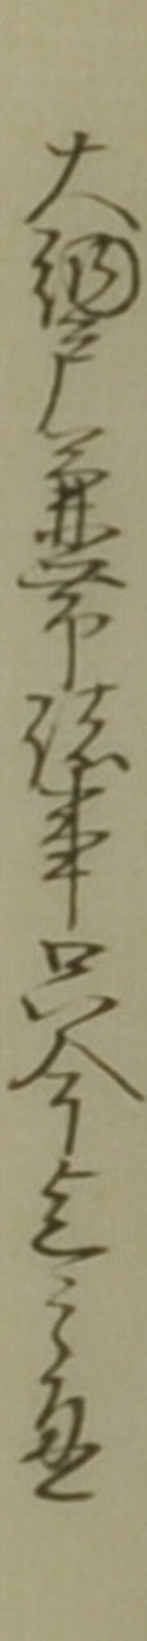大納戸兼帯諸事只今迄之通
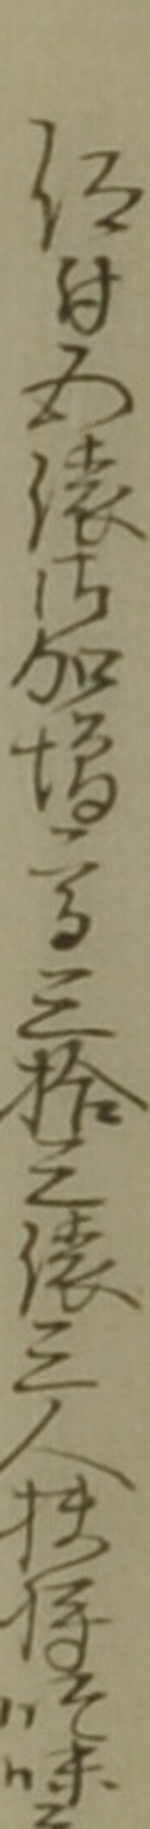仰付五俵御加増高三拾三俵三人扶持吟味方

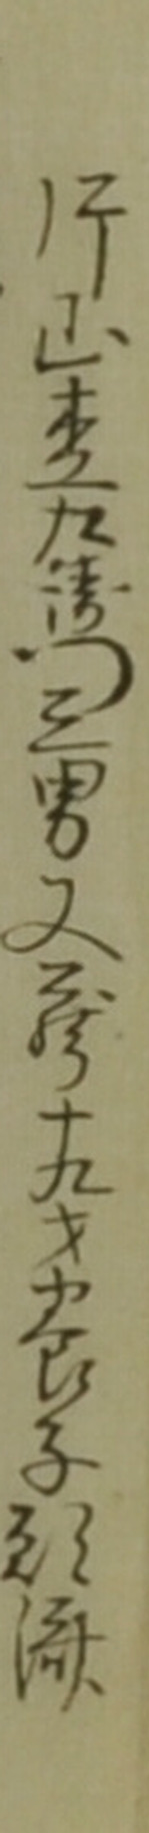片山杢左衛門三男又蔵十九才養子願済
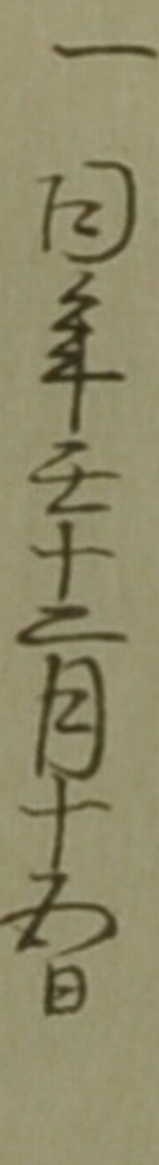一同年閏十二月十五日
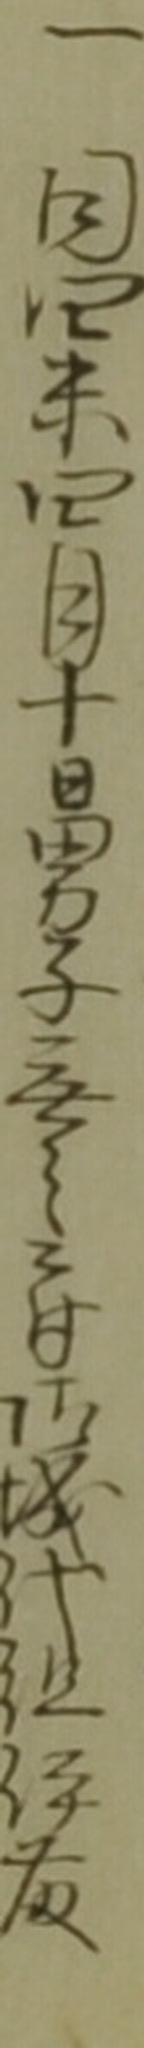一同四未四月十日男子無之ニ付御城代組伊藤
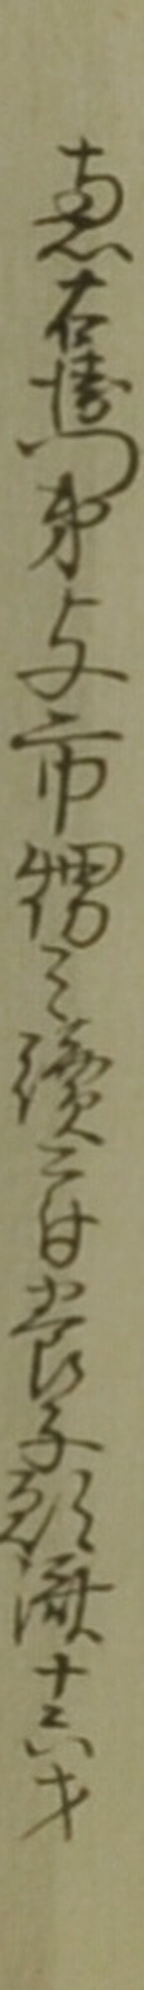恵右衛門弟与市甥之続ニ付養子願済十六才
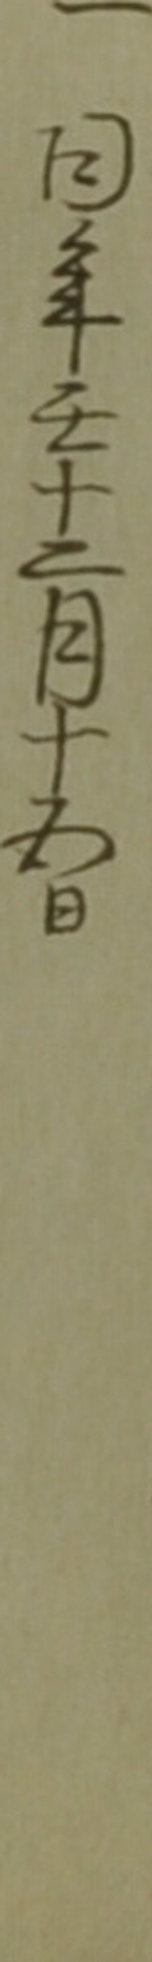一同年閏十二月十五日
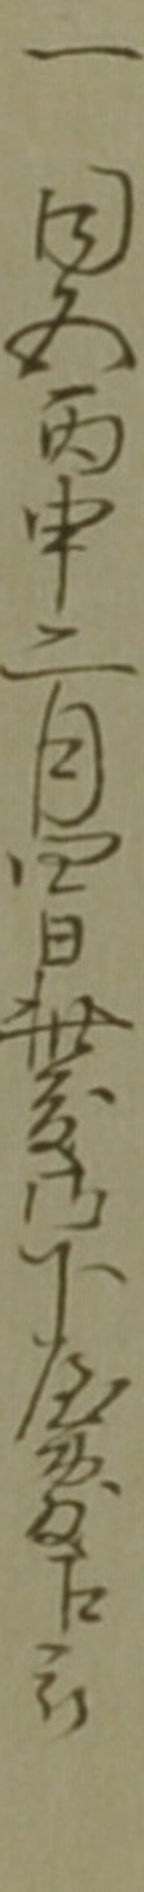一同五丙申二月四日此度御下屋敷江被
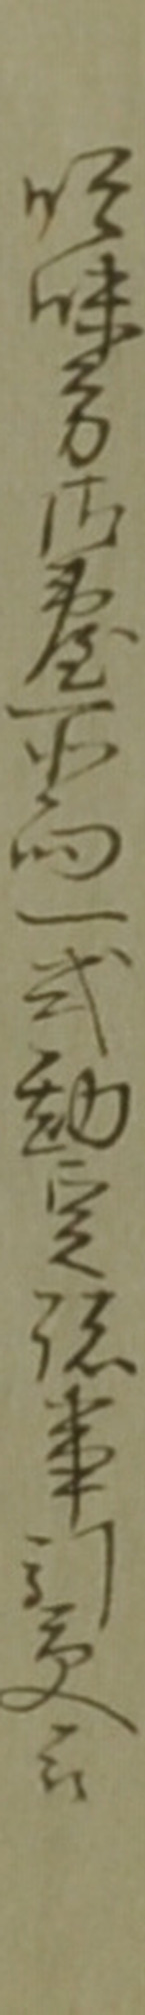吟味方御台所向一式勘定諸事引受被
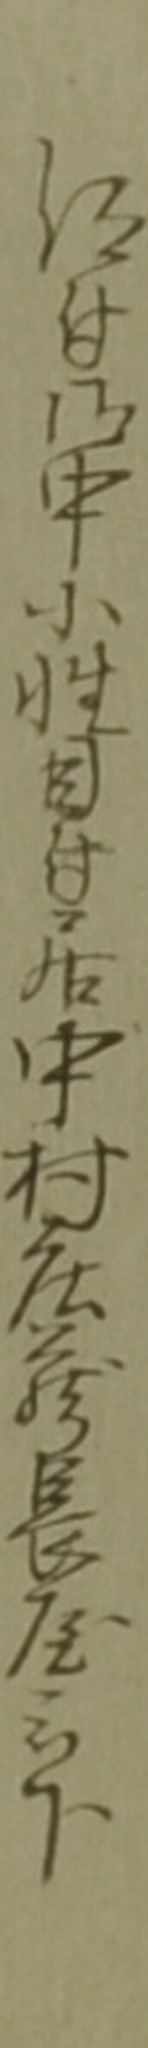仰付御中小性目付居中村庄蔵長屋被下
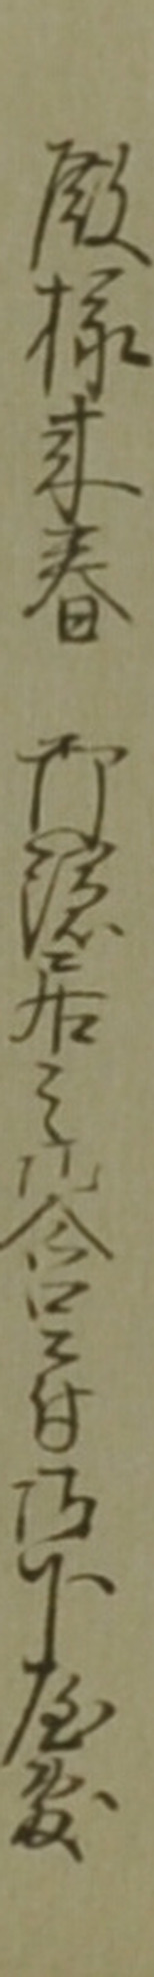殿様来春御隠居之御含ニ付御下屋敷
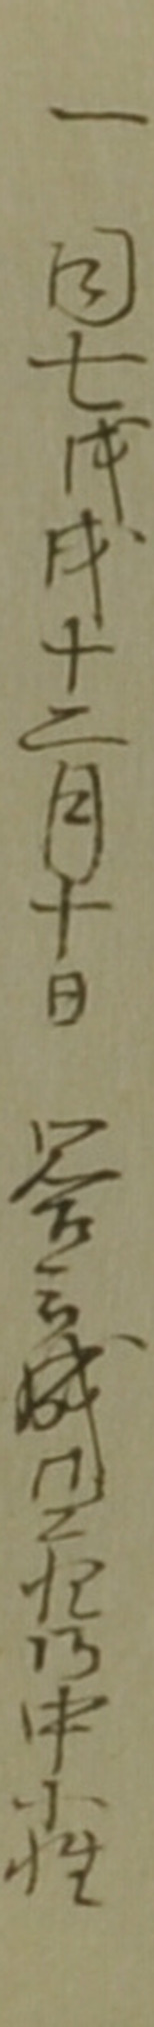一同七戊戌十二月十日思召被成御座御中小性
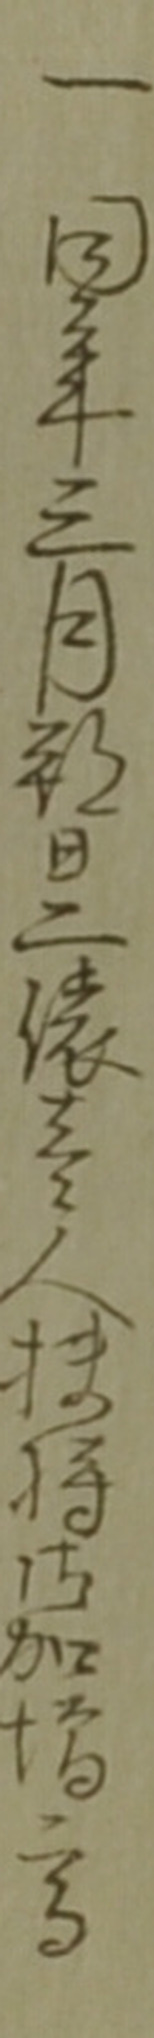一同年三月朔日二俵壱人扶持御加増高
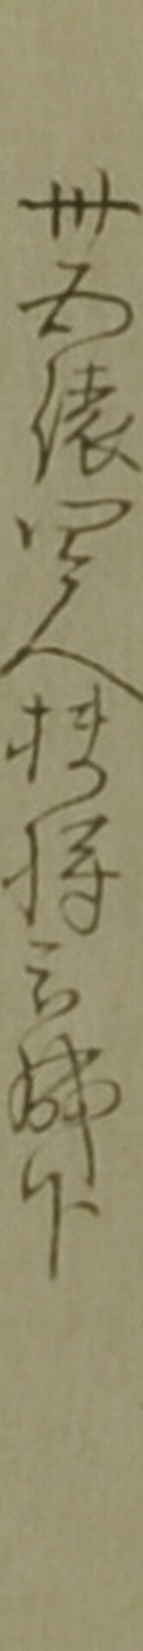卅五俵四人扶持被成下
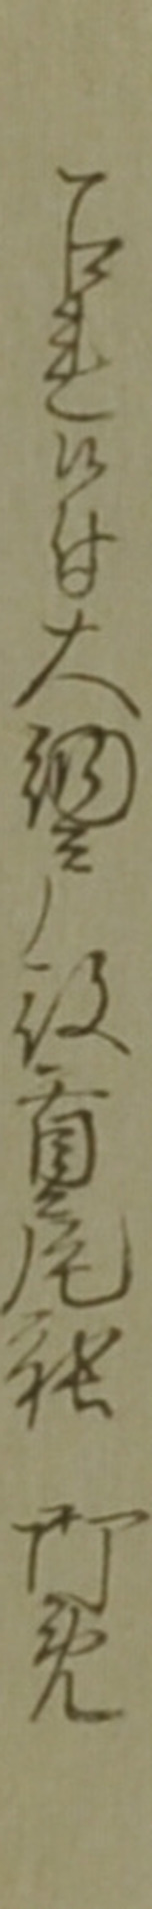召連候付大納戸役首尾能御免
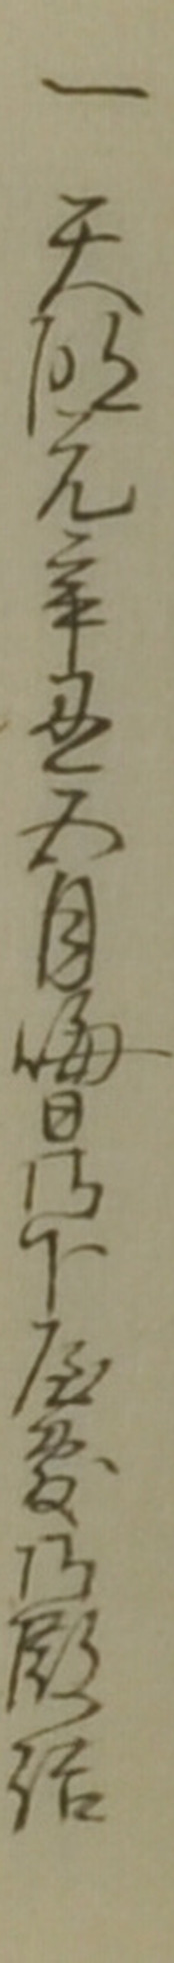一天明元辛丑五月晦日御下屋敷御殿詰
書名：無足廃家（弐）
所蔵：伊那市立高遠町図書館・合同会社AMANE
